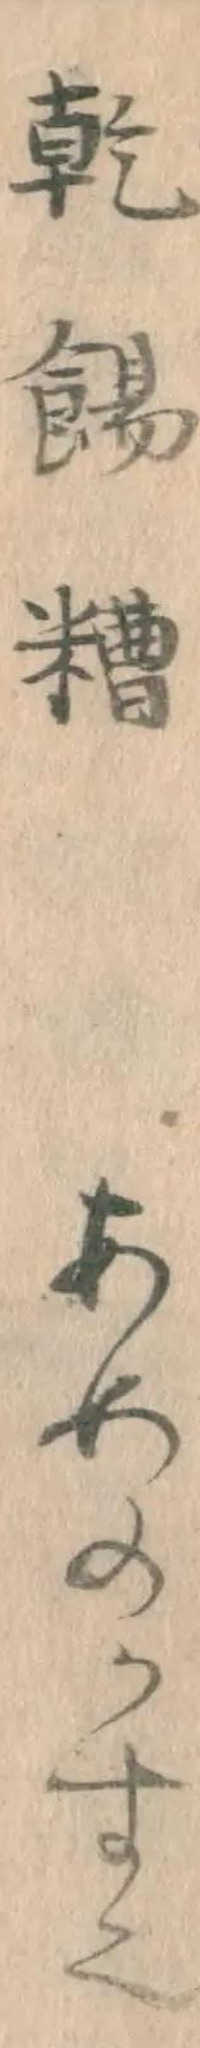乾餳糟あめのかす也
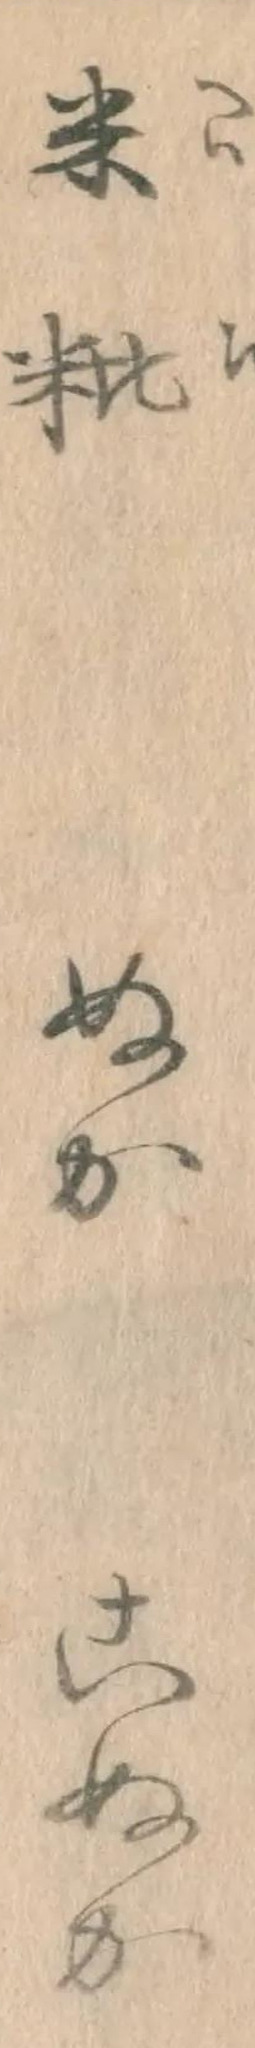米粃ぬかこぬか
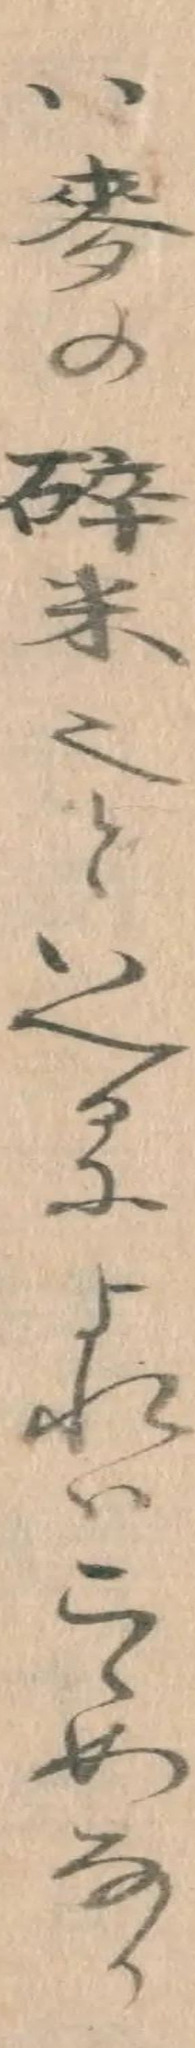は麦の砕米也といへるによれはこゝめなり
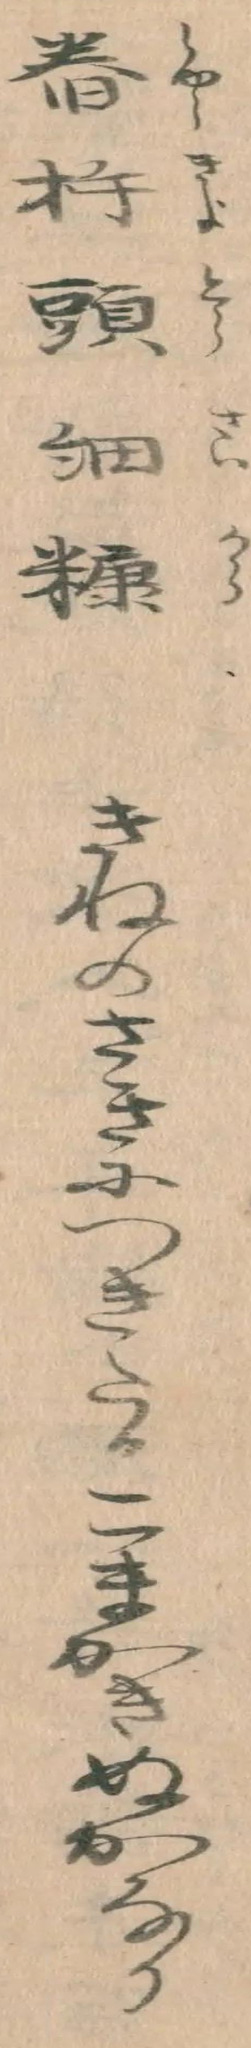舂杵頭細糠きねのさきにつきたるこまかきぬかなり

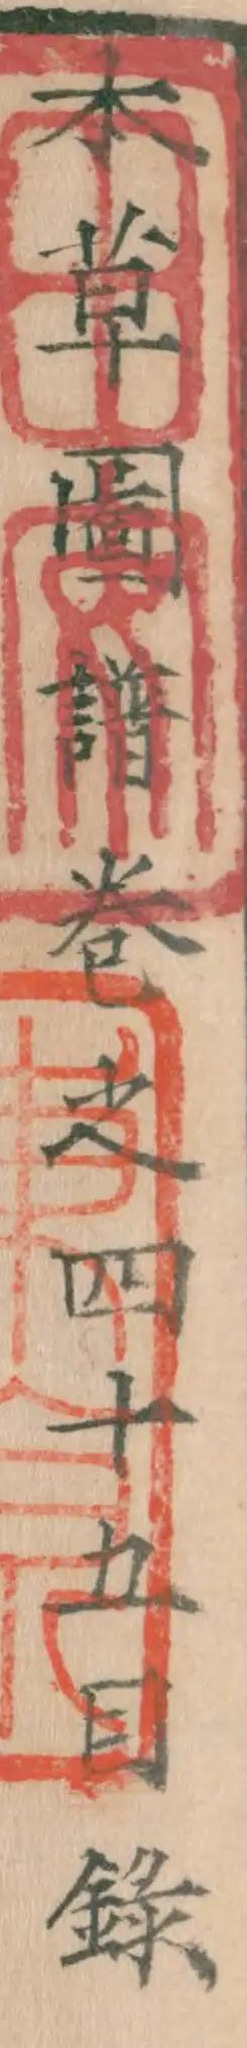本草図譜巻之四十五目録

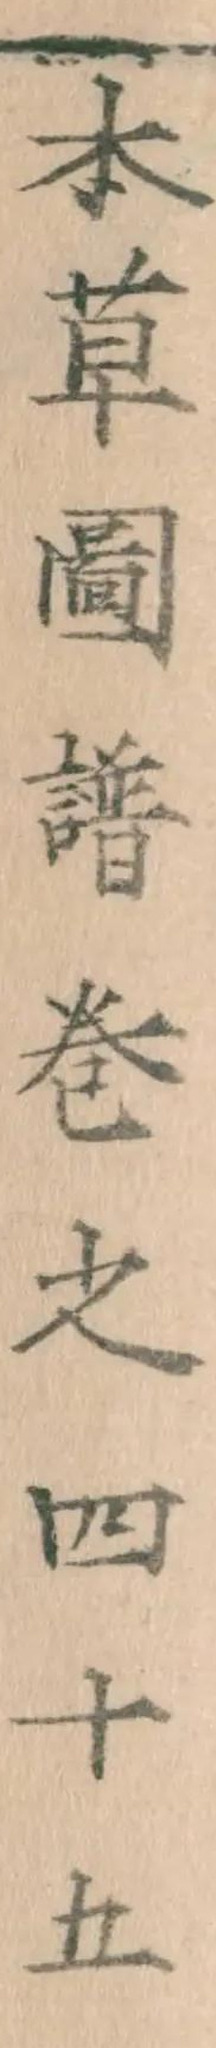本草図譜巻之四十五
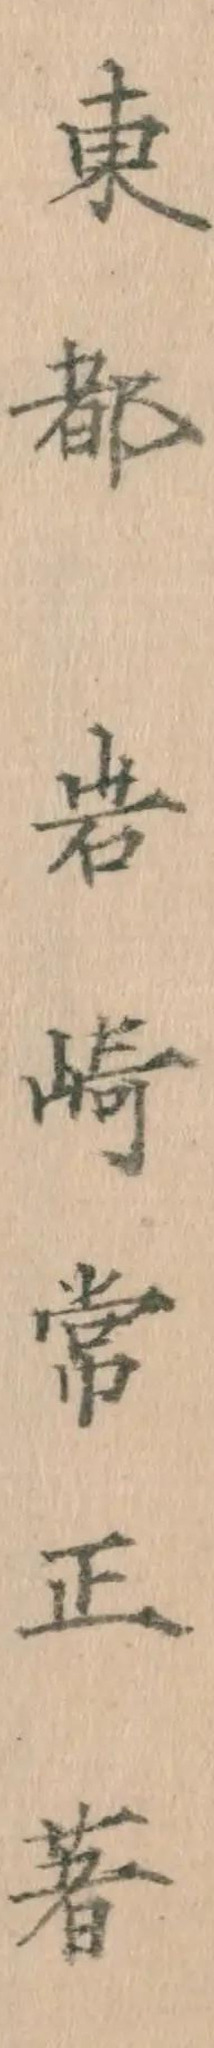東都岩崎常正著

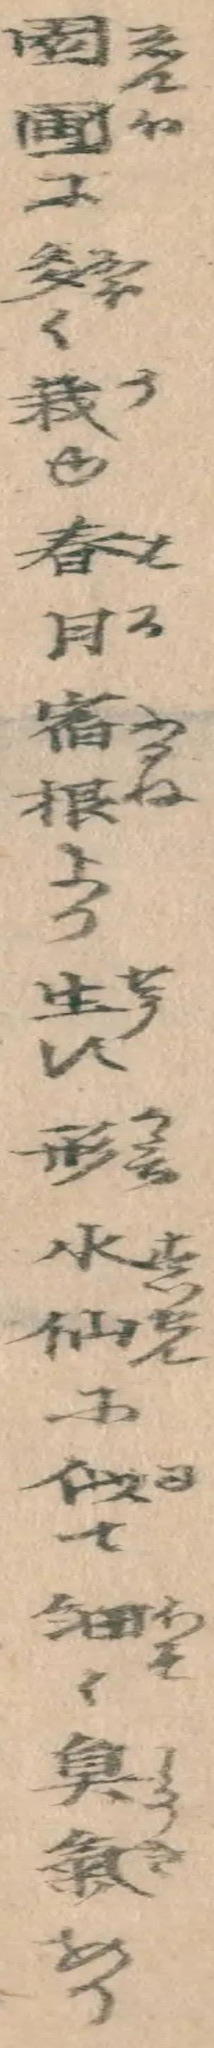園圃に多く栽ゆ春月宿根より生す形水仙に似て細く臭気あり
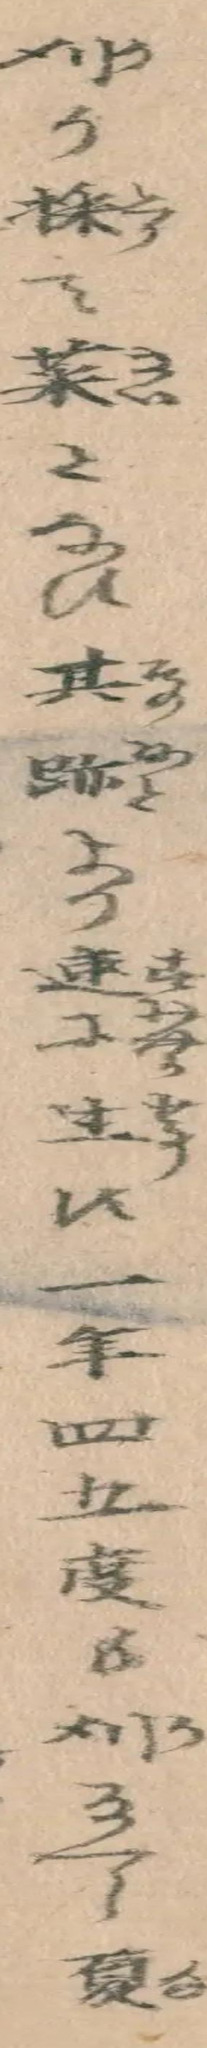刈り採て菜となす其跡より速に生す一年四五度も刈るへし夏
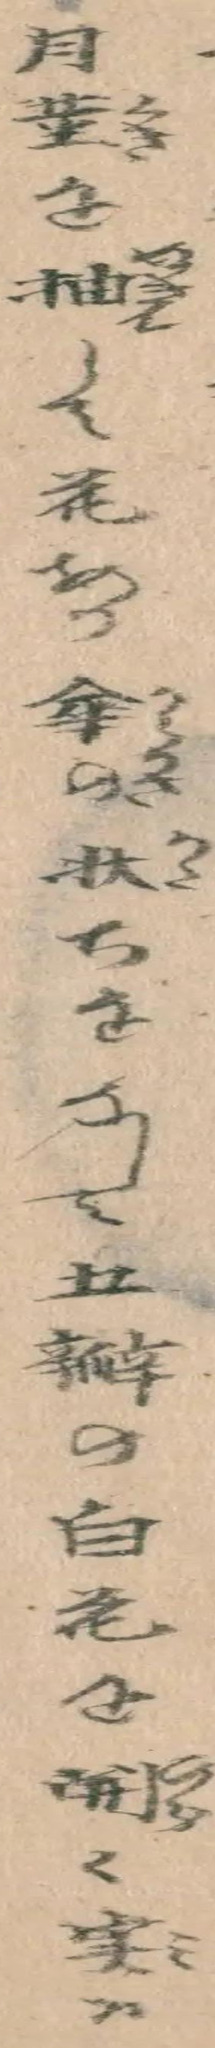月茎を抽して花あり傘の状ちをなして五弁の白花を開く実は
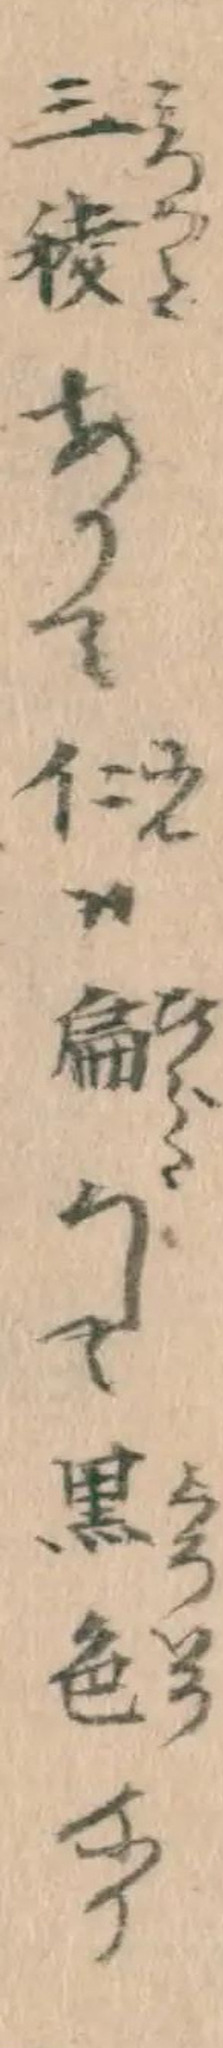三稜ありて仁は扁くして黒色なり

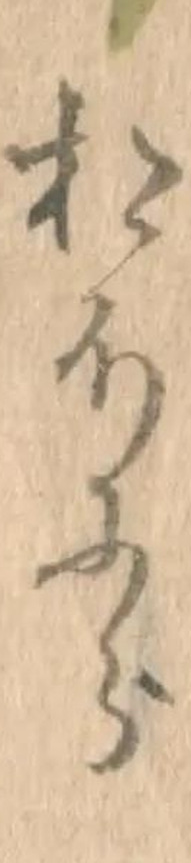おほにら
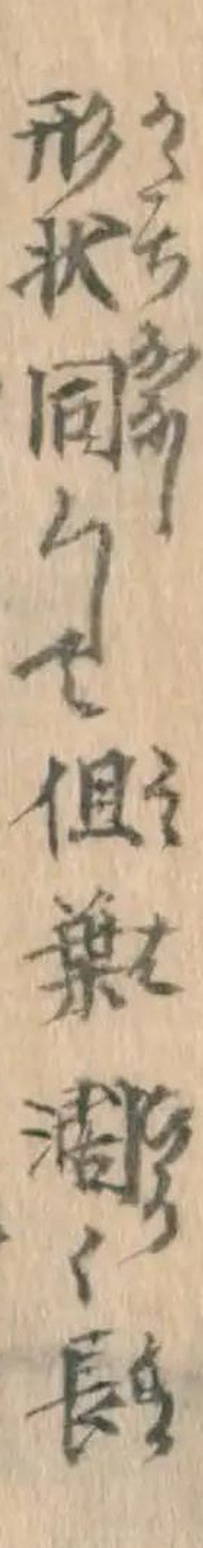形状同くして但葉闊く長
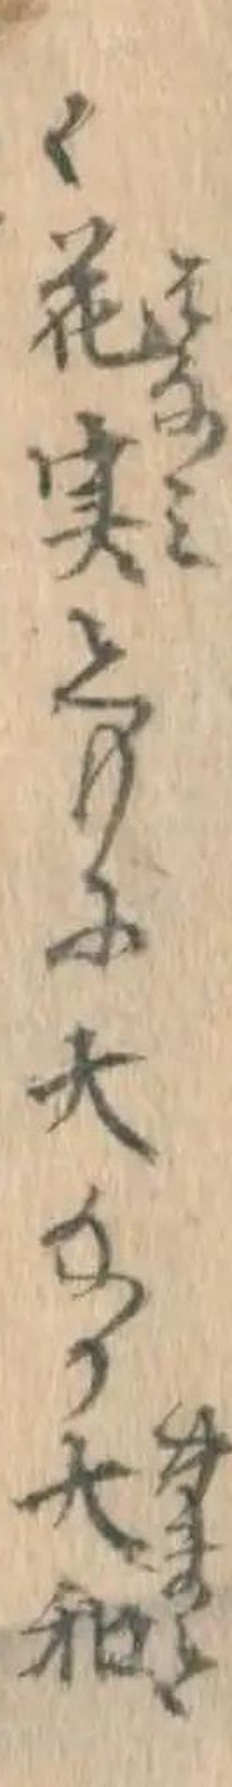く花実ともに大なり大和
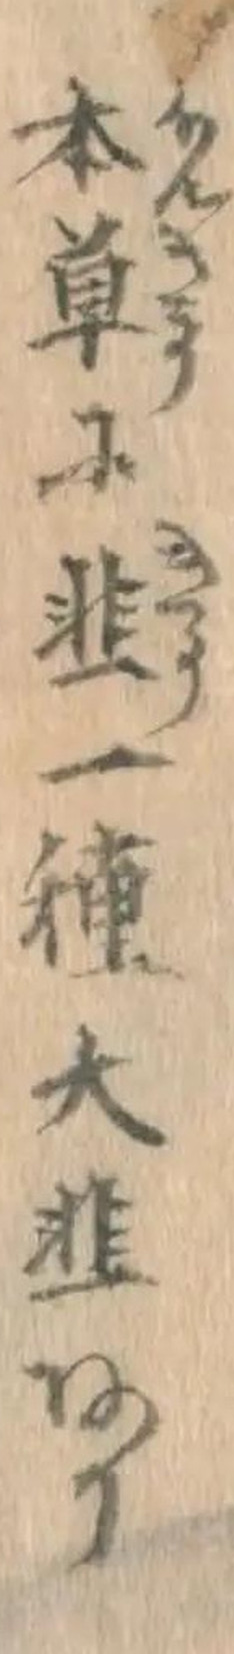本草に韭一種大韭なり
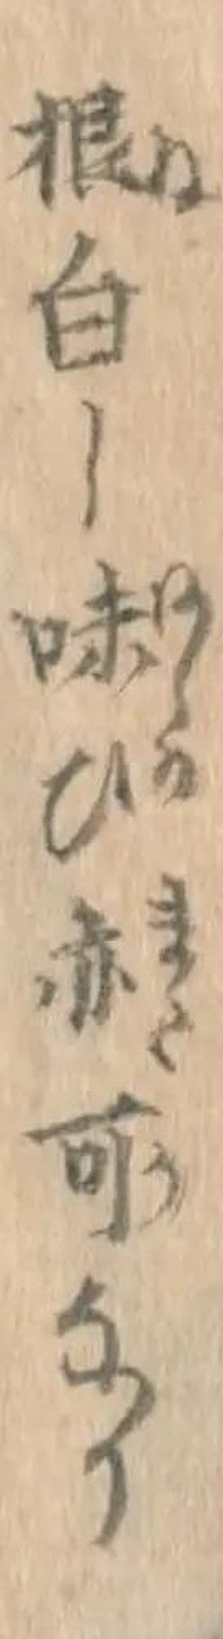根白し味ひ亦可なり
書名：本草図譜. 巻43-45
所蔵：国立国会図書館 National Diet Library, JAPAN
